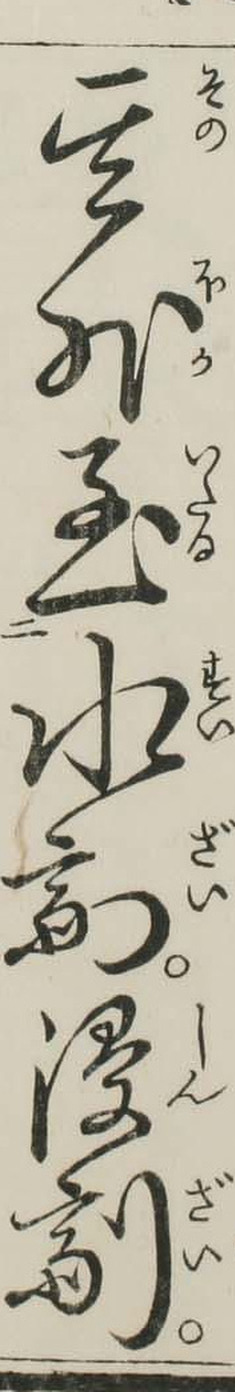其外至水剤。浸剤。
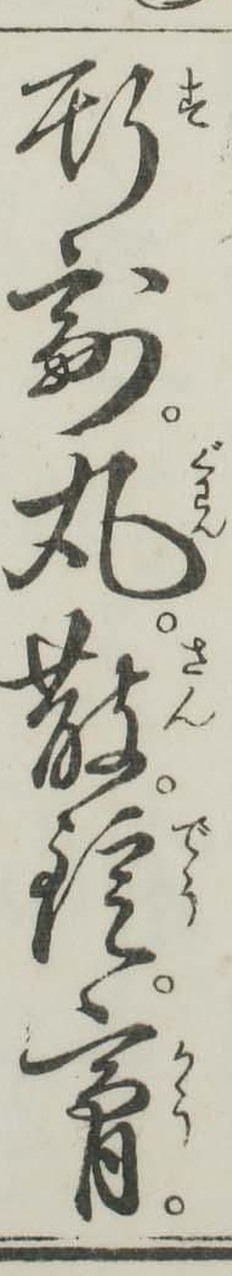斯剤。丸。散。錠。膏。
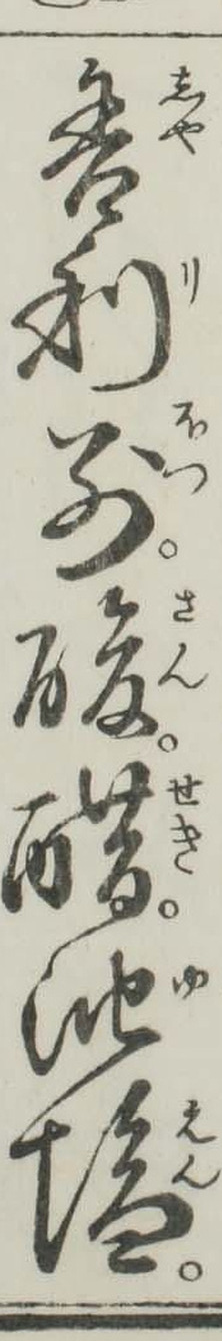舎利別。酸。醋。油煙。
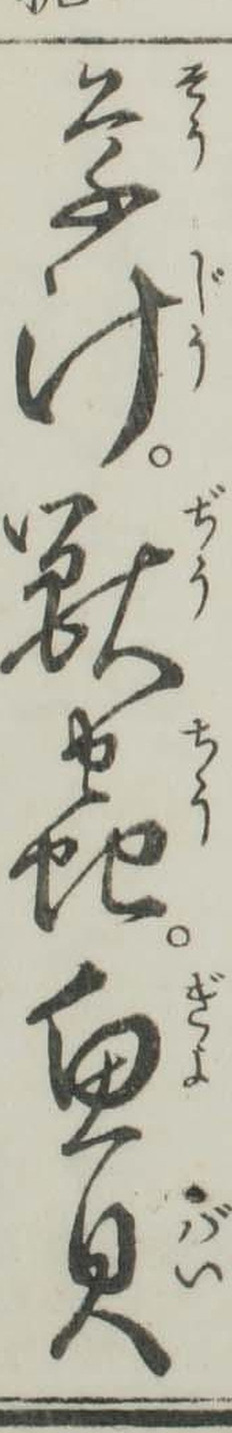草汁。獣蟲。魚貝

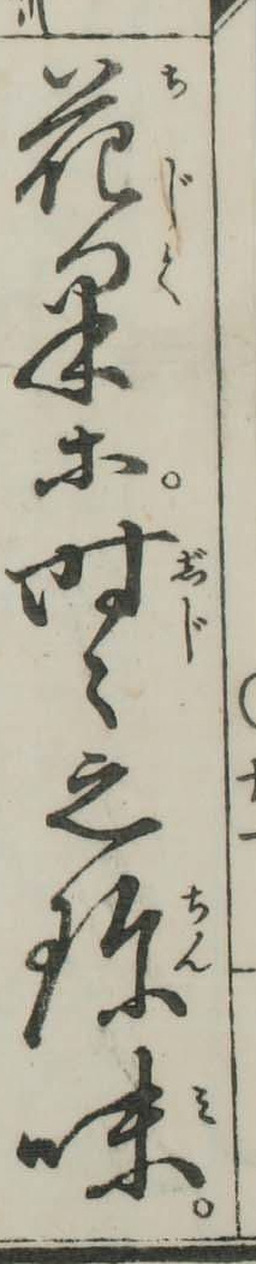花果等。時々之珍味
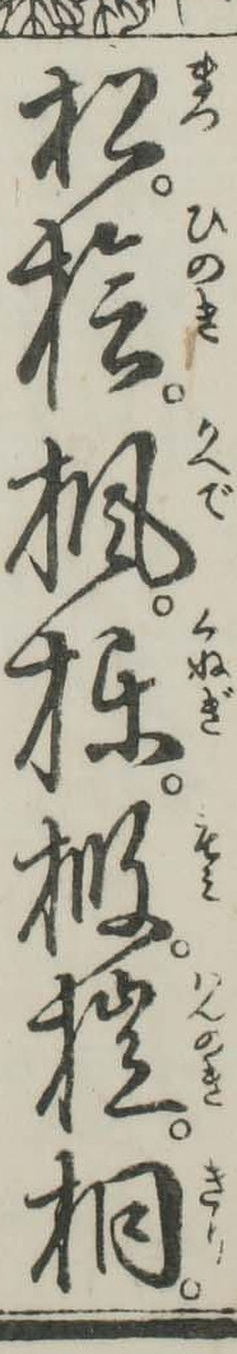松。桧。楓。櫟。椴。榿。桐。
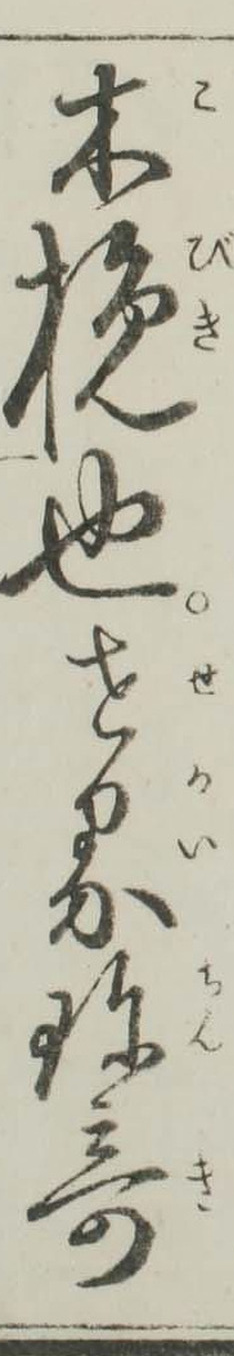木挽也。世界珍奇
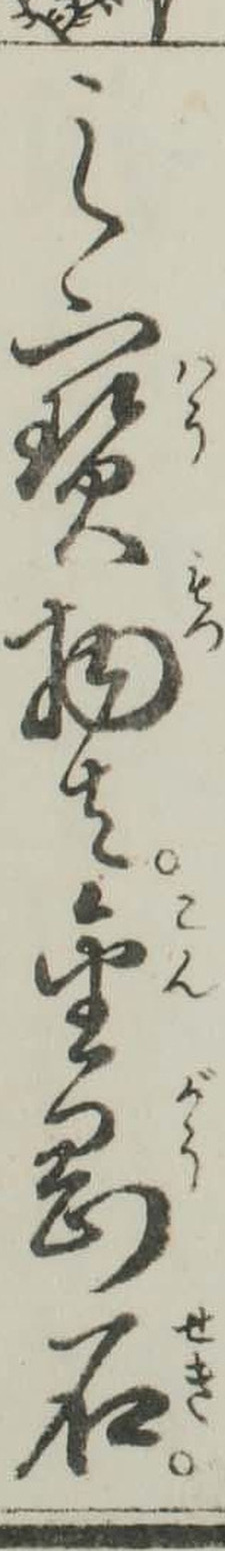之宝物は。金剛石。

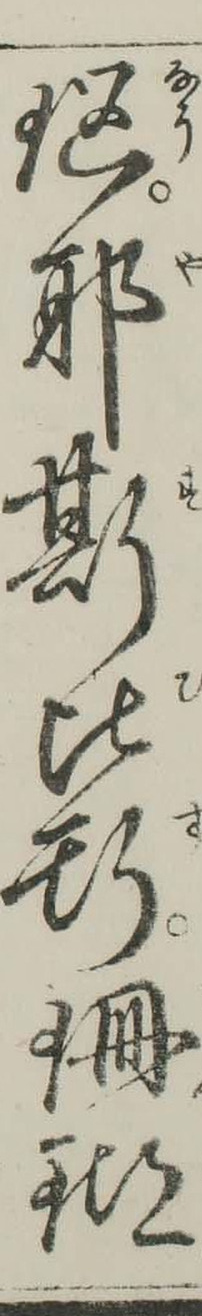瑙。耶斯比斯。珊瑚。
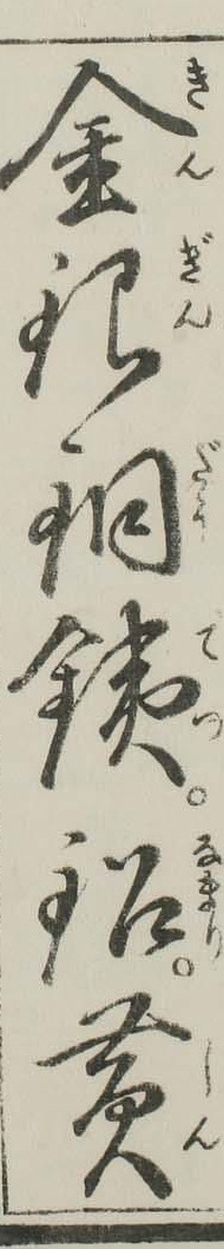金銀銅鉄。鉛。黄
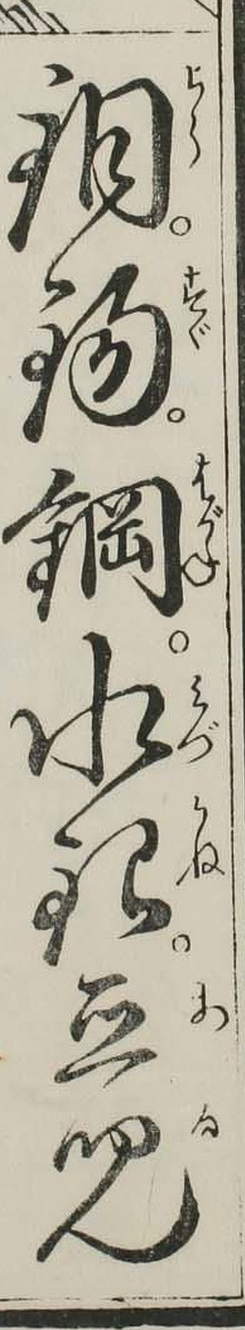銅。錫。鋼。水銀。亜児
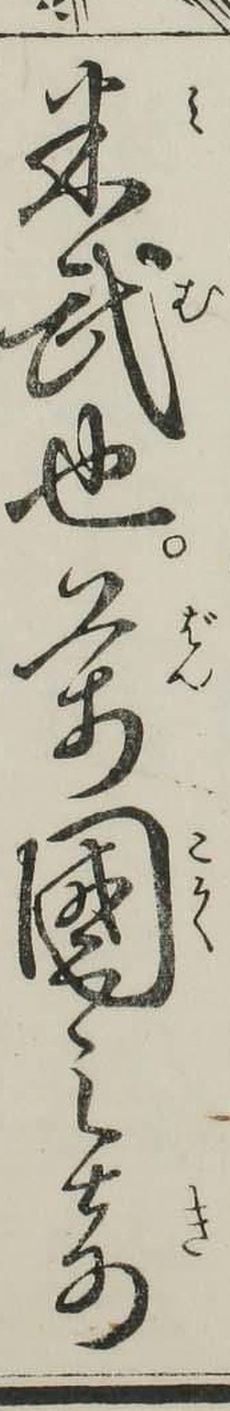米武也。萬国之奇
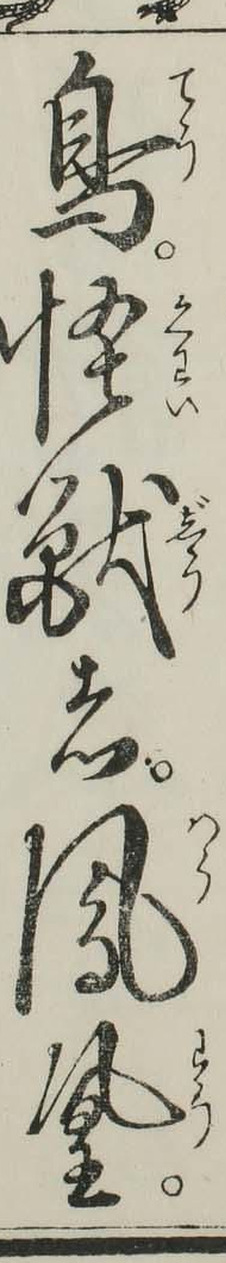鳥。怪獣は。鳳凰。
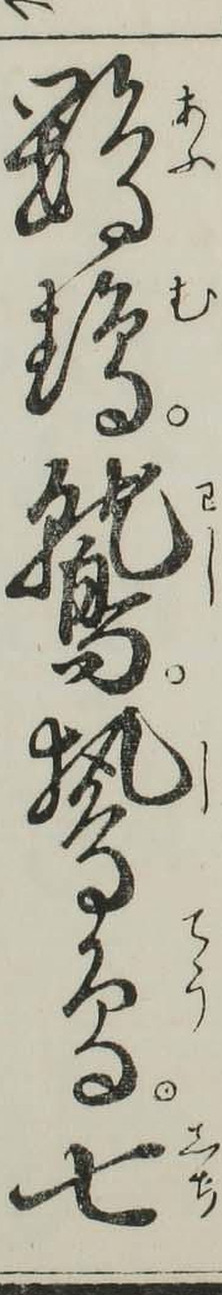鸚鵡。鷲。鷙鳥。七
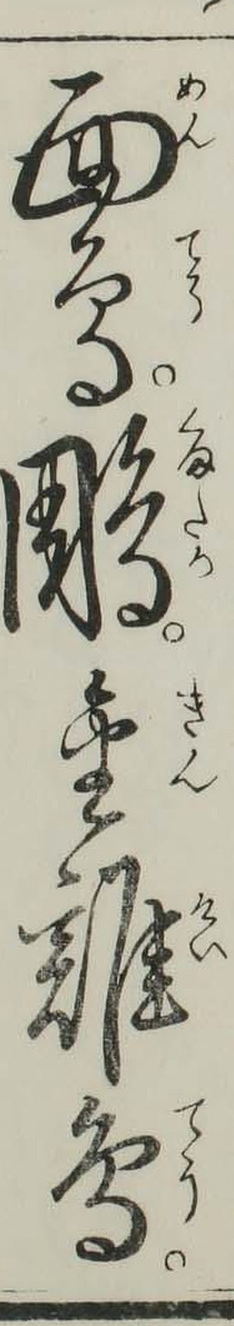面鳥。鵰。金鶏鳥。

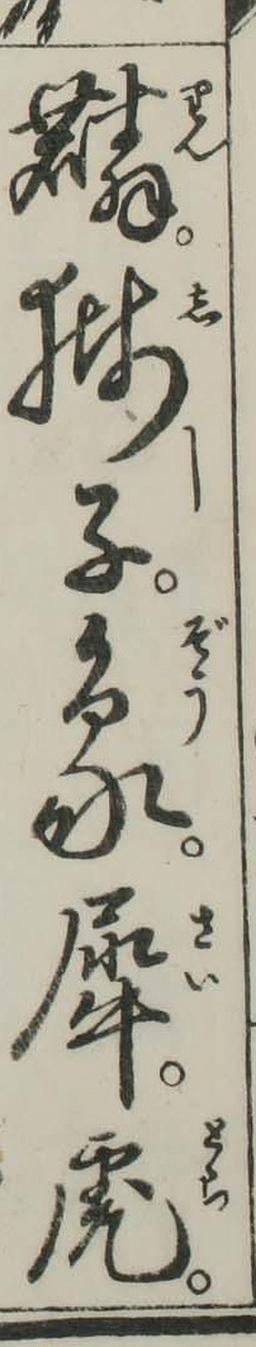麟。獅子。象。犀。虎。
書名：開化往来
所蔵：東京学芸大学教育コンテンツアーカイブ
